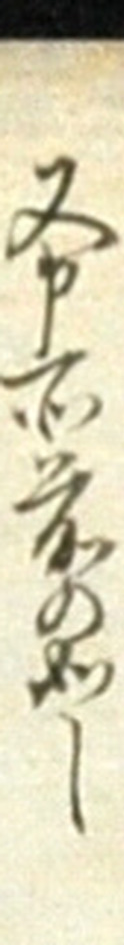又申所前の如し
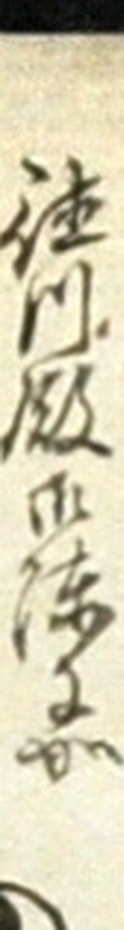徳川殿御陣にか
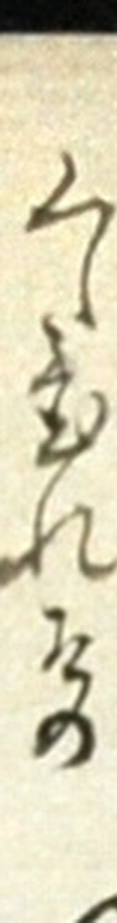くし置れその
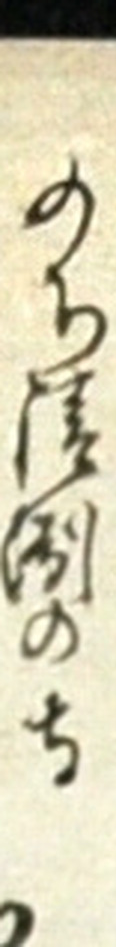のち清洲の寺
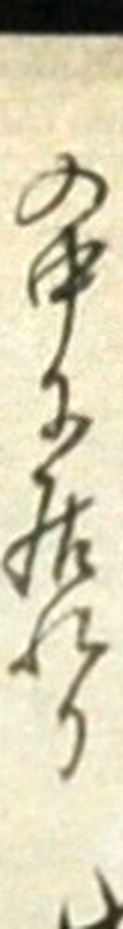の中に居れり
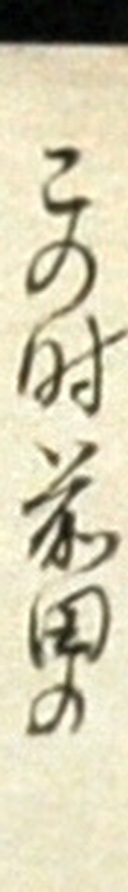この時前田の
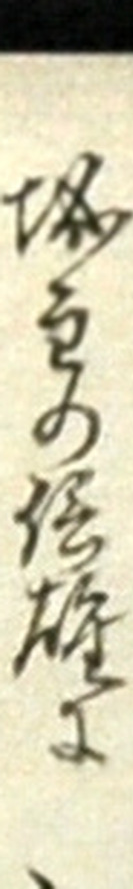城主の信雄に
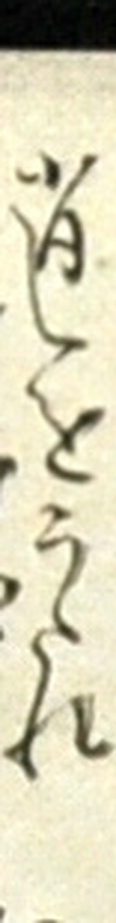背しをうたれ
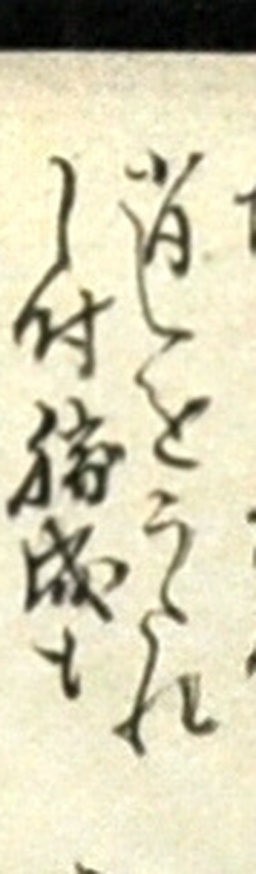し時勝成も
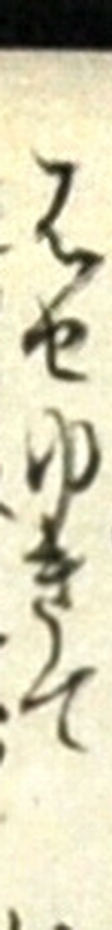はせゆきて
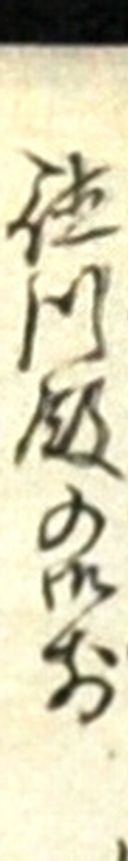徳川殿の御前
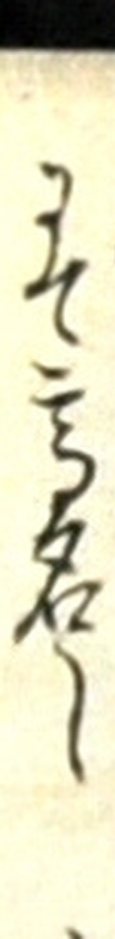にて高名し

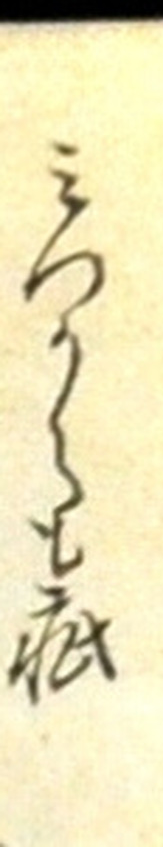みつからも疵
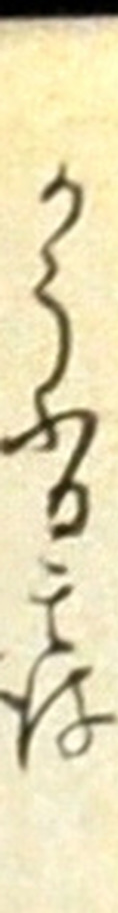かうふる其後
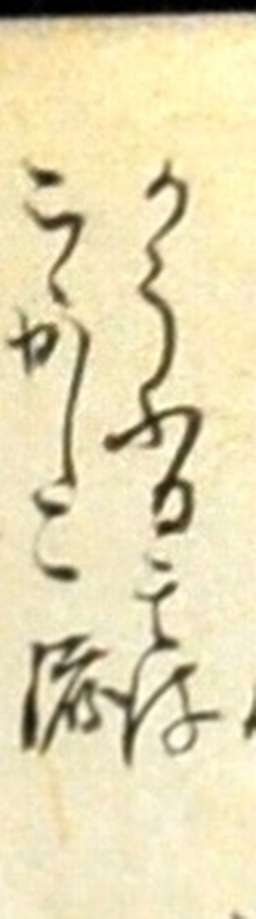こゝかしこ流
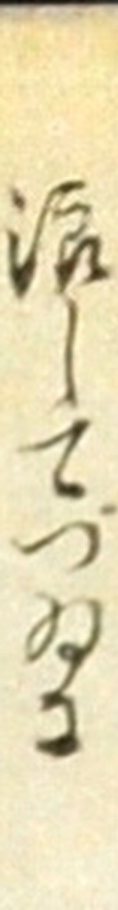浪してつゐに
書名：藩翰譜（二・三）
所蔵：伊那市立高遠町図書館・合同会社AMANE
